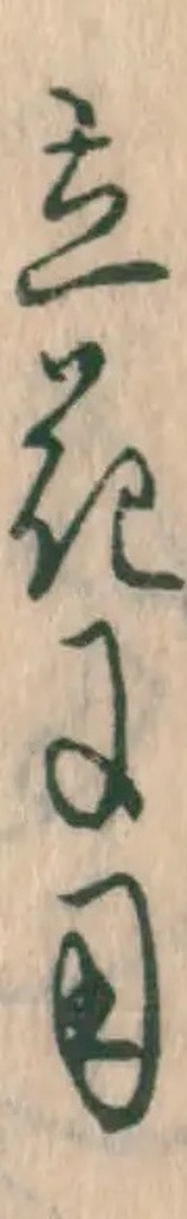立花に用
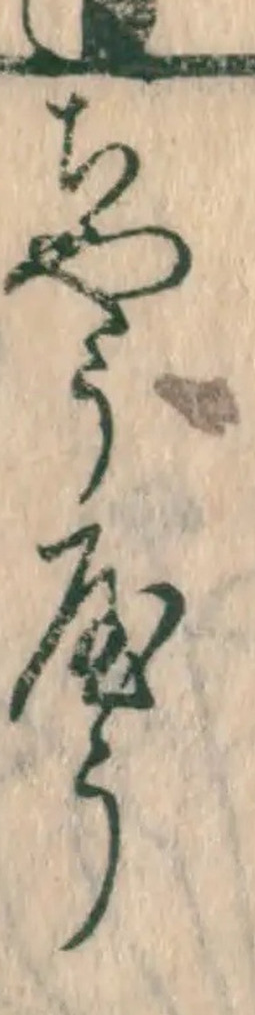ちやうやう
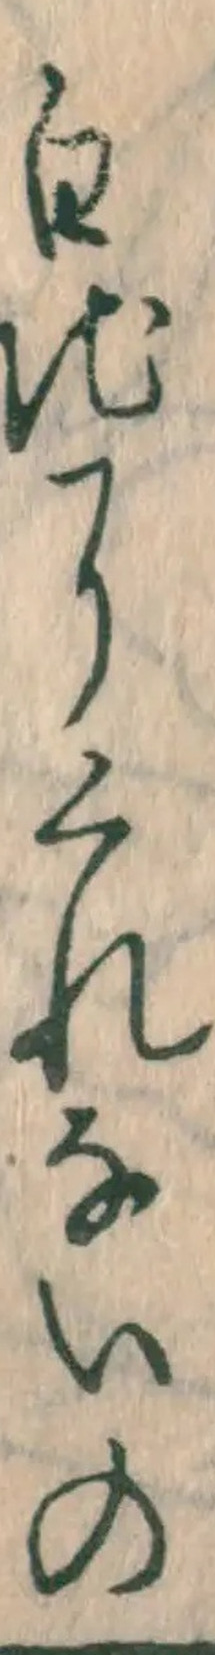白地にくれないの
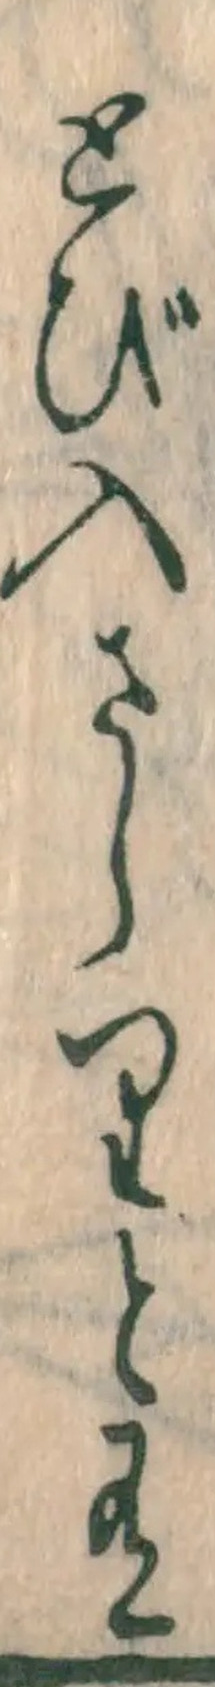とび入さらりと有
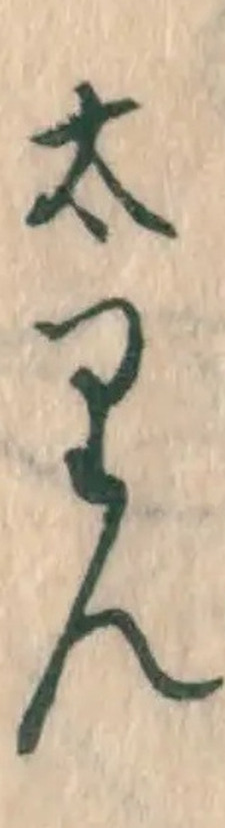太りん

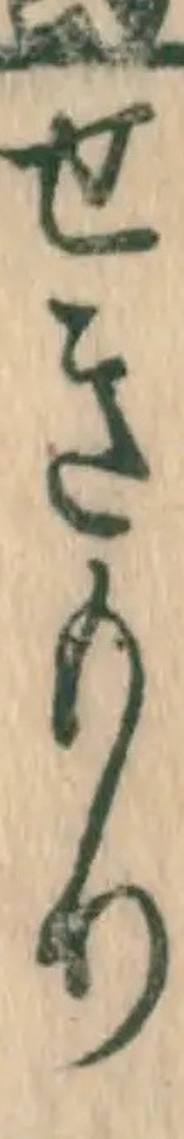せきもり
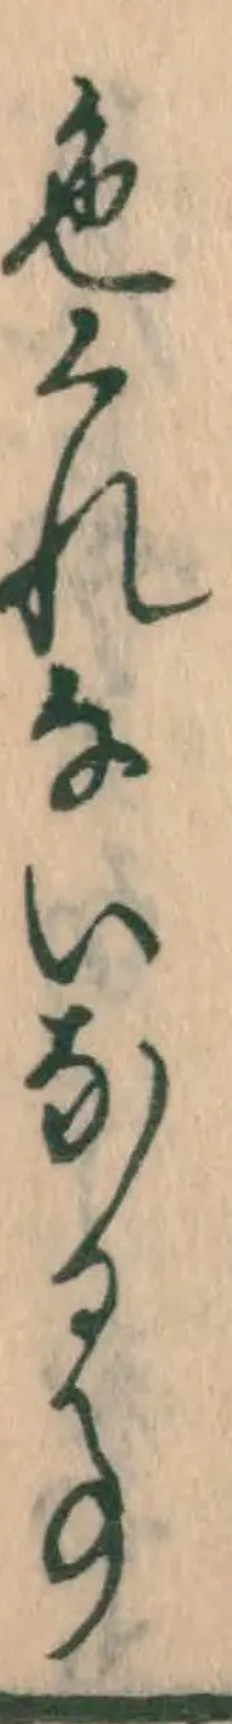色くれないなる事
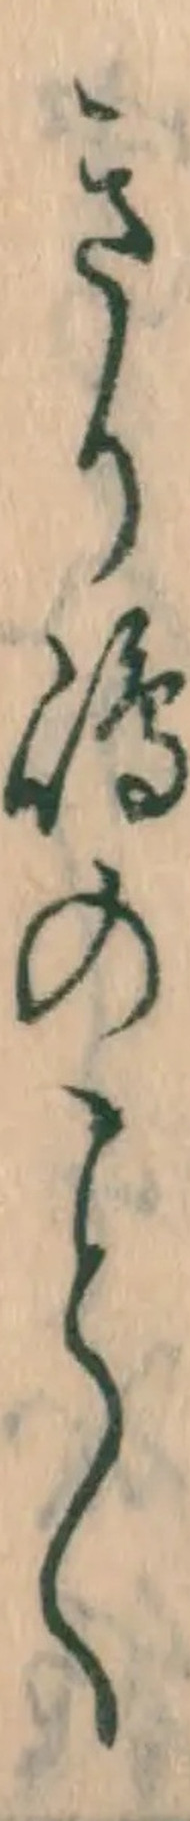きり嶋のことく
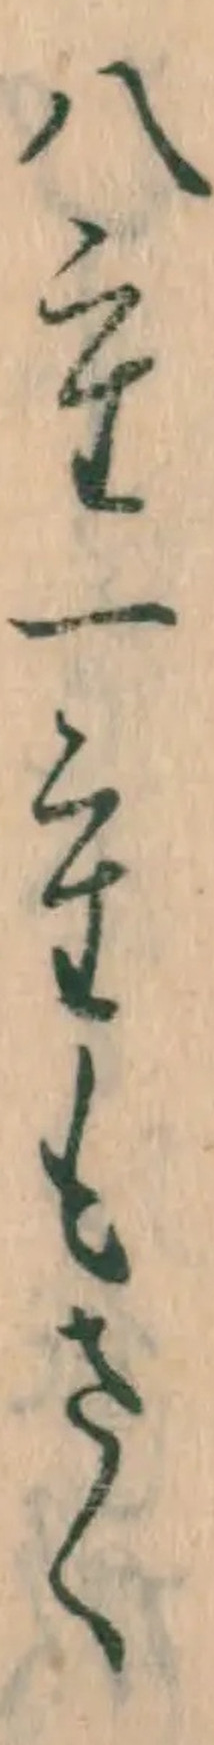八重一重もさく
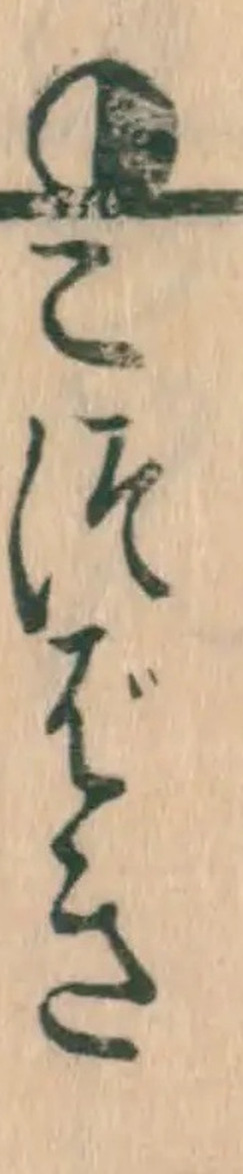こつばき
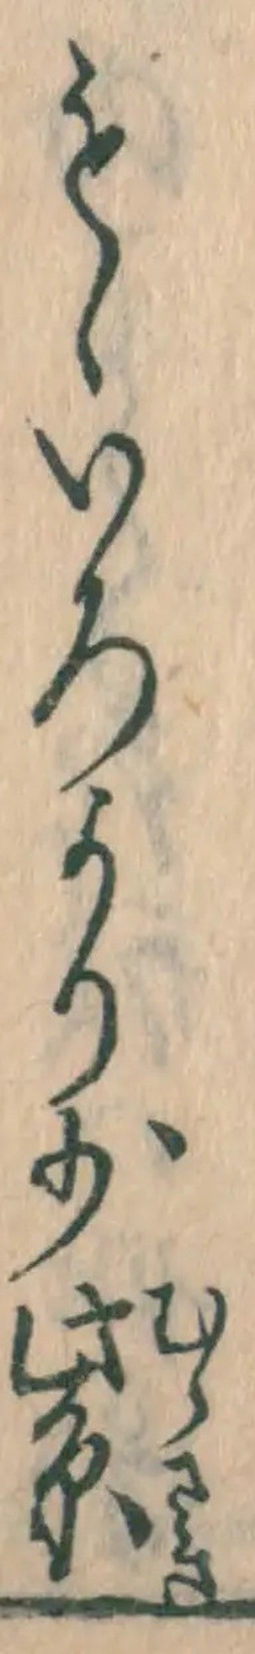もゝいろより少紫

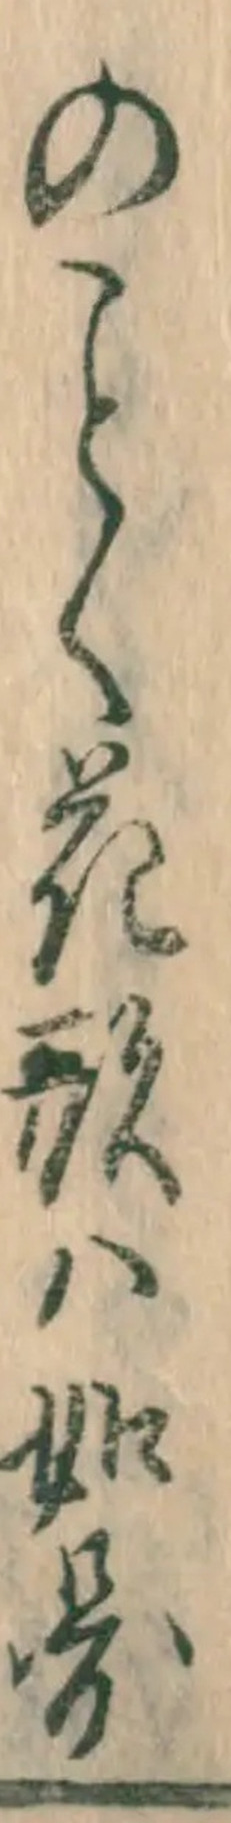のことく花形は如図
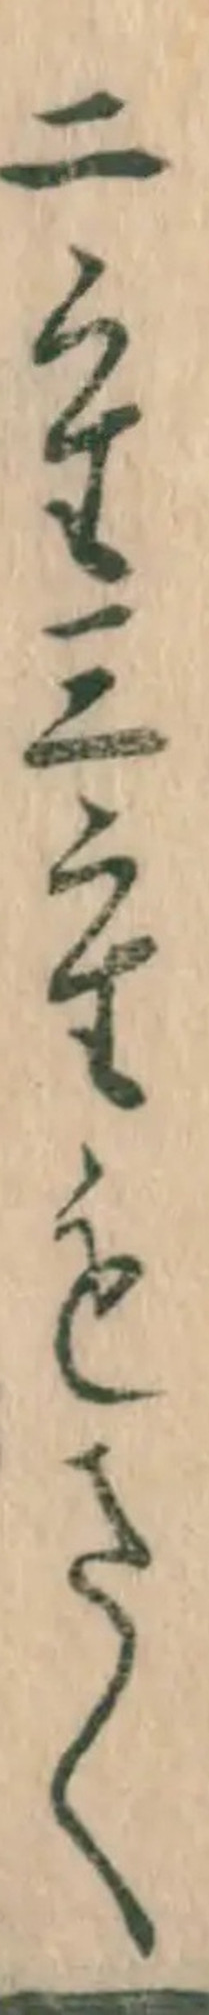二重三重もさく
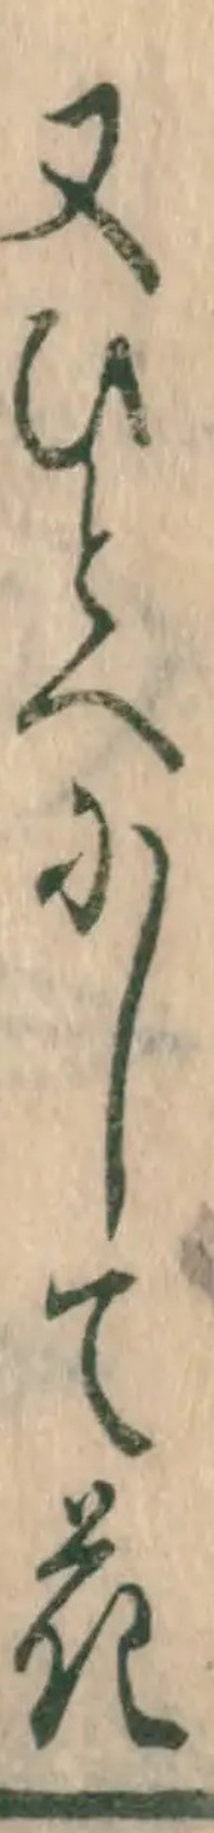又ひとへにして花
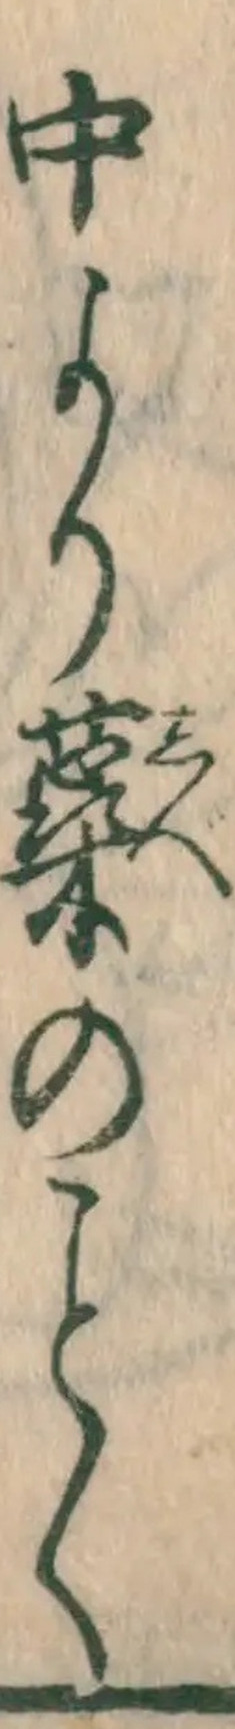中より蘂のことく
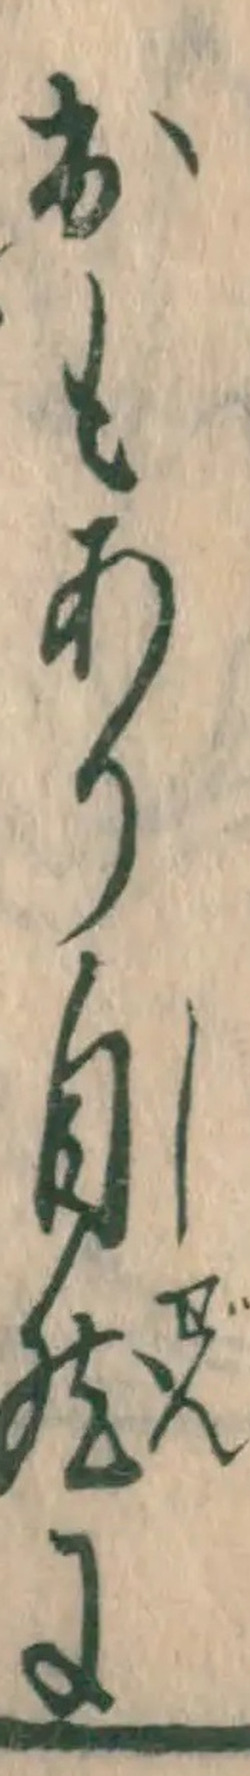出もあり自然に
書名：錦繍枕 5巻. [5]
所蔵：国立国会図書館 National Diet Library, JAPAN
